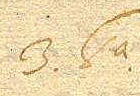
3. Ta.
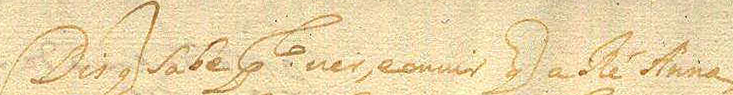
Dis q̄ sabe p.lo uer, e ouuir q̄ a Ré Anna
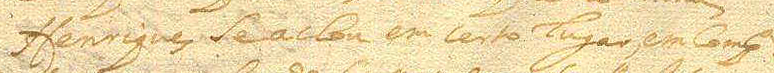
Henriques se achou em certo lugar, em comp.a
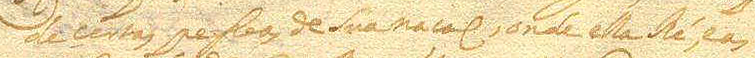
de certas pessoas de sua naçā, onde ella Ré, e as
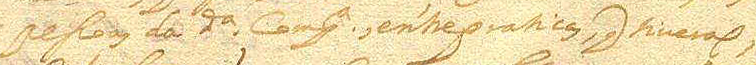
pessoas da da. Comp.a, entre praticas, q̄ tiuerā
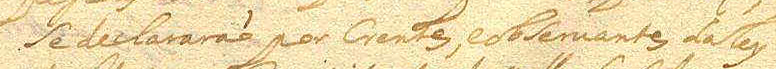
se declararaõ por Crentes, e obseruantes da ley
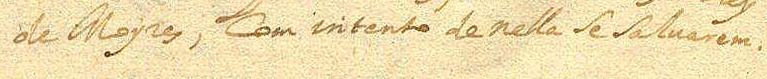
de Moyzes, Com intento de nella se saluarem.
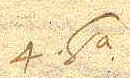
4. Ta.
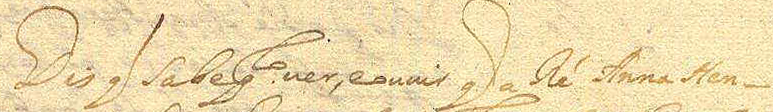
Dis q̄ sabe plo. uer, e ouuir q̄ a Ré Anna Hen
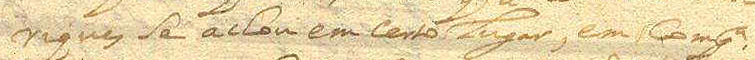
riques se achou em certo Lugar, em Compa.
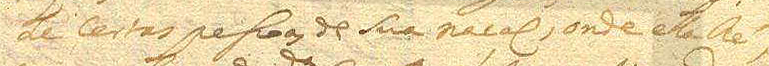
de certas pessoas de sua naçā, onde ella Re,
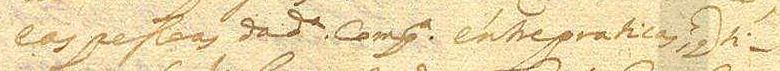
e as pessoas da d.a comp.a entre praticas, q̄ ti
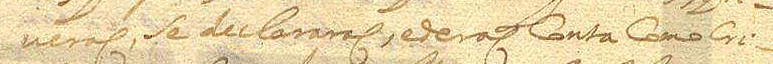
uerā, se declararā, e derā Conta Como Cri
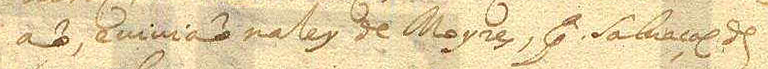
aõ, e uiuiaõ na ley de Moyzes, pa saluaçā de
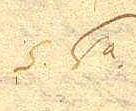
5. Ta.
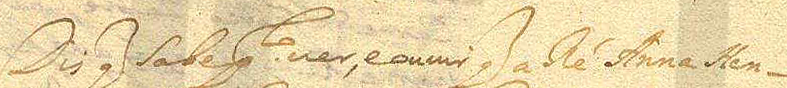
Dis q̄ sabe plo. uer, e ouuir q̄ a Ré Anna Hen
